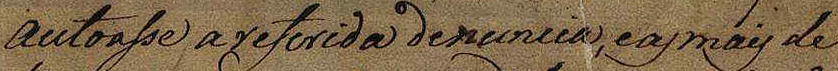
autoasse a referida denuncia, e as mais de
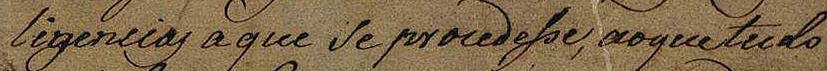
ligencias a que se procedesse, ao que tudo
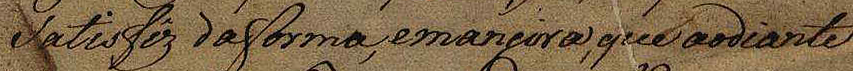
satisfêz da forma, e maneira, que ao diante
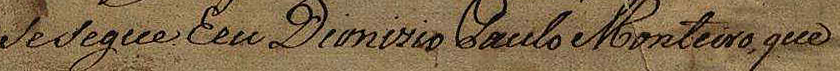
se segue E eu Dionizio Paulo Monteiro, que
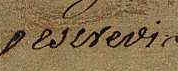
o escrevi
